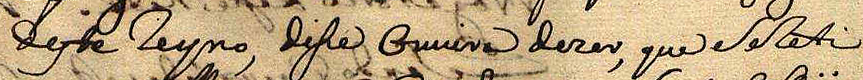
deste Reyno, disse Ouuira dizer, que se Reti
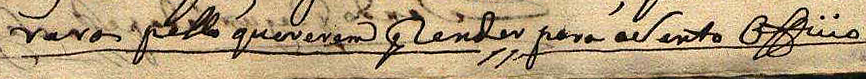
rara pello quererem pRender para o Santo Officio
